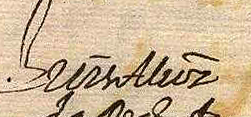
Luis Aluz̄
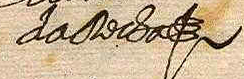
da Rocha
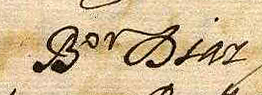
Bor Diaz
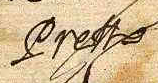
Pretto
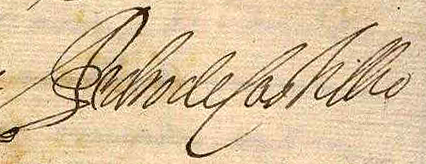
Pedro de Castilho
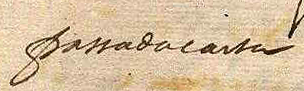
passada carta
